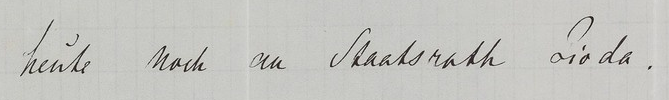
heute noch an Staatsrath Pioda.
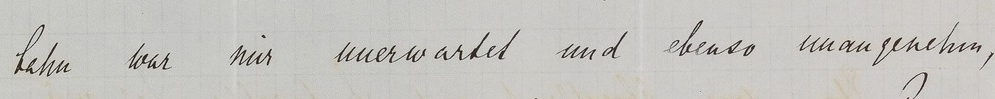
bahn war mir unerwartet und ebenso unangenehm,
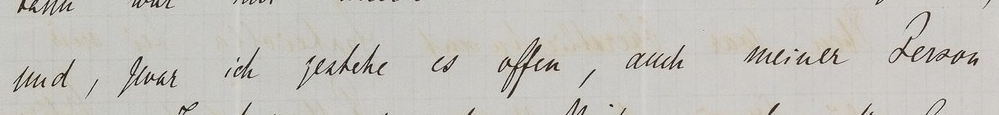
und, zwar ich gestehe es offen, auch meiner Person
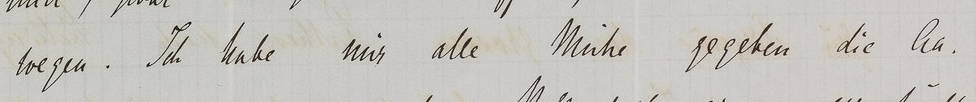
wegen. Ich habe mir alle Mühe gegeben die Aa-
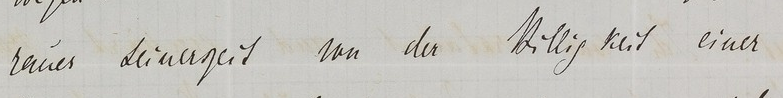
rauer seinerzeit von der Billigkeit einer
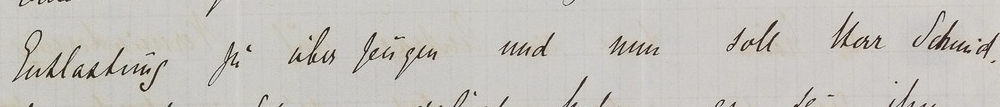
Entlastung zu überzeugen und nun soll Herr Schmid-
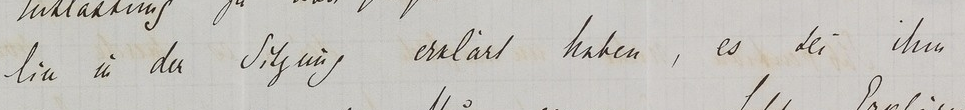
lin in der Sitzung erklärt haben, es sei ihm
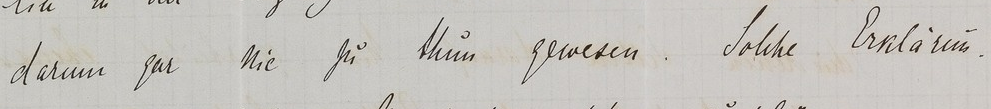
darum gar nie zu thun gewesen. Solche Erklärun-
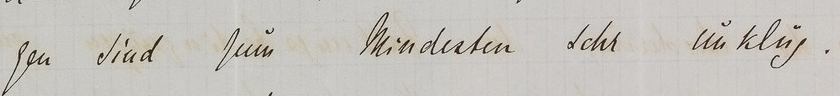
gen sind zum Mindesten sehr unklug.
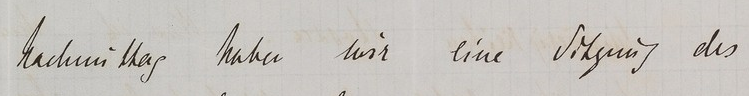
Nachmittag haben wir eine Sitzung des
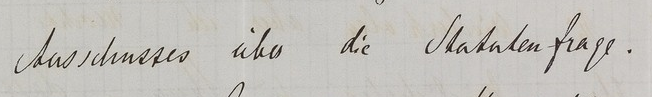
Ausschusses über die Statutenfrage.
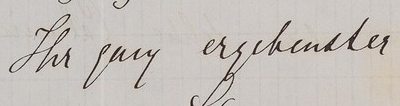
Ihr ganz ergebenster
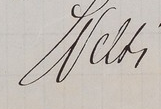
1870.
